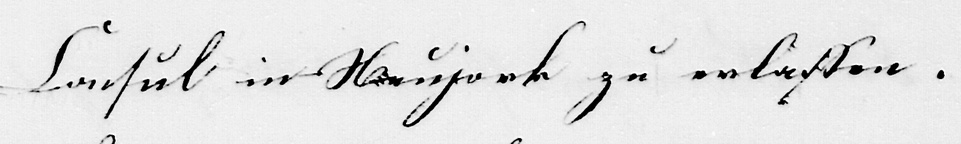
Consul in Neujork zu erlassen.
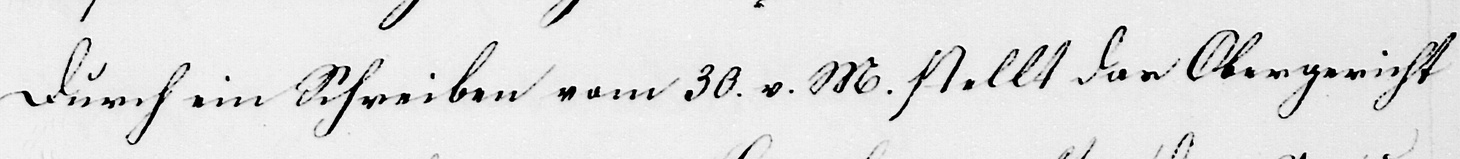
Durch ein Schreiben vom 30. v. M. stellt das Obergericht
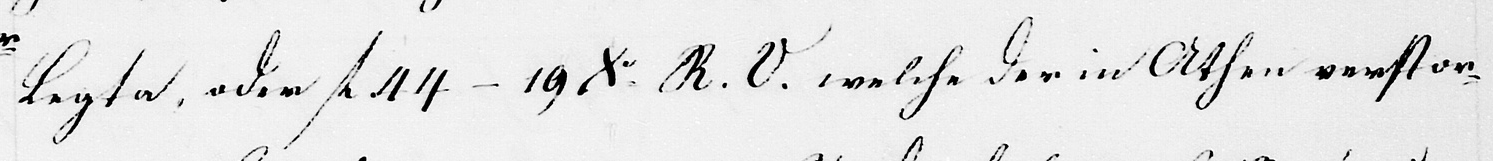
Leyta, oder fl 44 – 19 Xr. R. V. welche der in Athen verstor¬
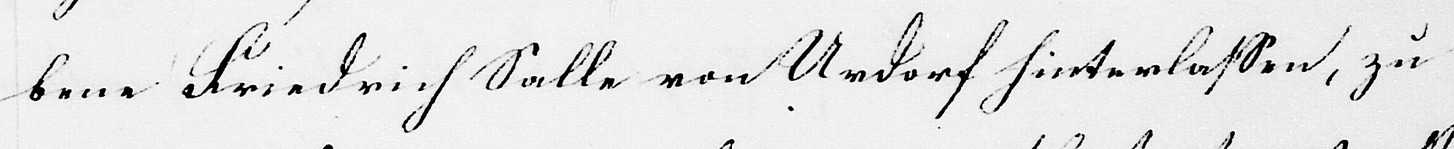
bene Friedrich Salle von Urdorf hinterlaßen, zu
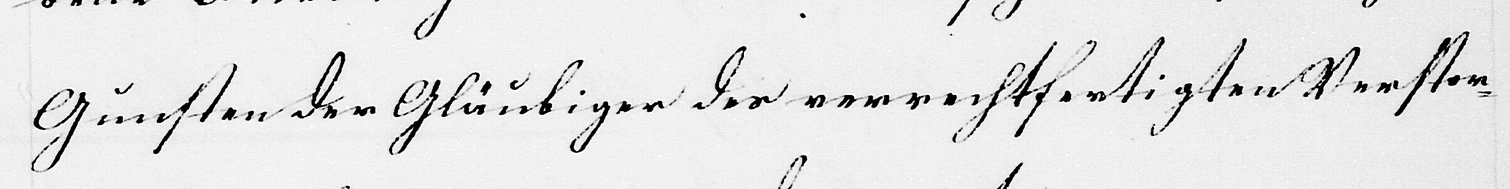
Gunsten der Gläubiger der verrechtfertigten Verstor¬
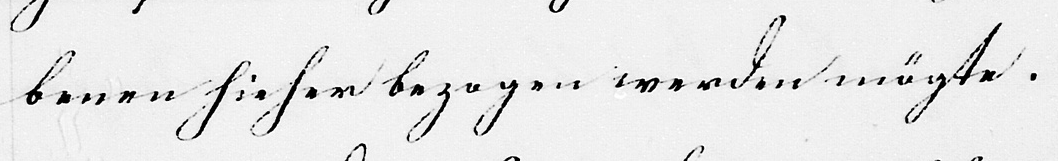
benen hieher bezogen werden mögte.
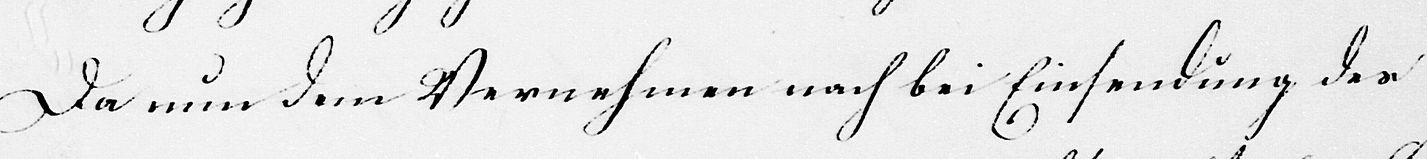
Da nun dem Vernehmen nach bei Einsendung des
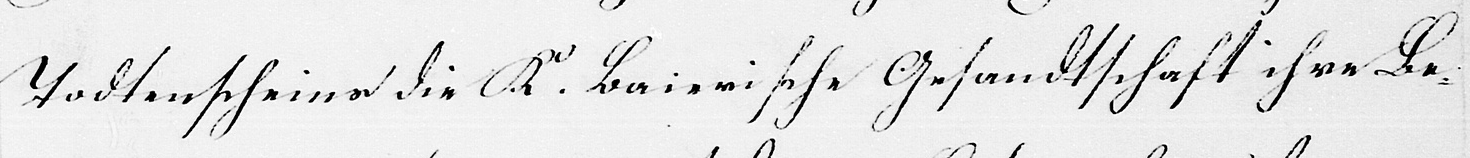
Todtenscheins die K. Baierische Gesandtschaft ihre Be¬
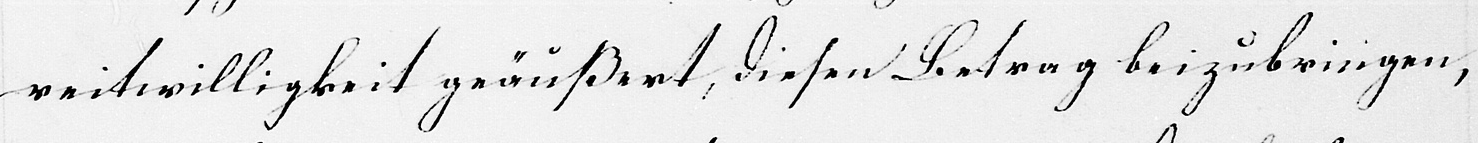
reitwilligkeit geäußert, diesen Betrag beizubringen,
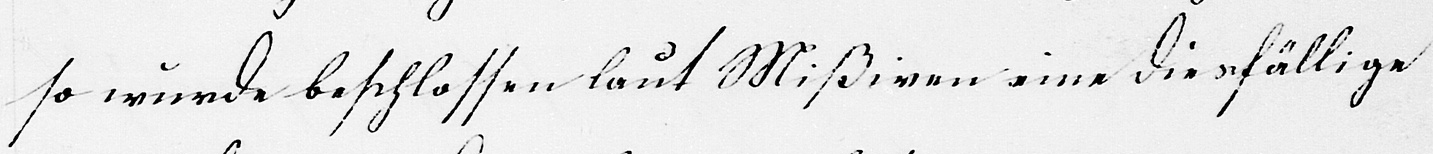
so wurde beschlossen laut Mißiven eine diesfällige
